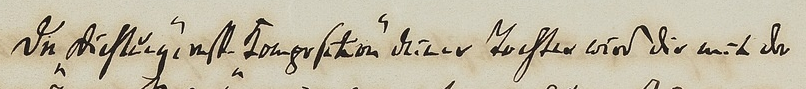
Die «Dichtung» rsp. «Komposition» deiner Tochter wird dir mit der
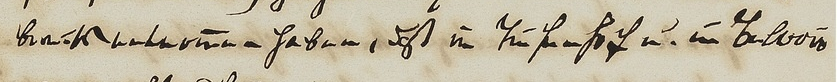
bereits entnommen haben, daß im Tiefenhof u. im Belvoir
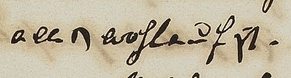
alles wohlauf ist.
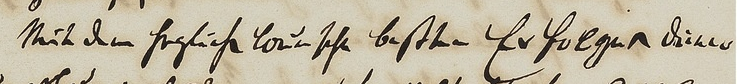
Mit dem herzlichen Wunsche beßten Erfolges deiner
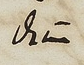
dein
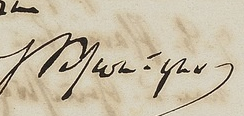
F Schweizer
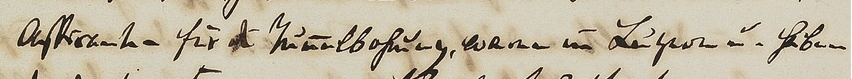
Aspiranten für die Tunnelbohrung, waren in Luzern u. haben
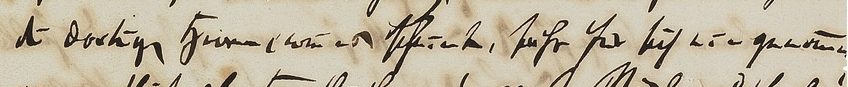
die dortigen Herren, wie es scheint, sehr für sich eingenommen;
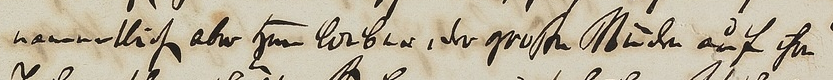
namentlich aber Herrn Weber, der große Stücke auf ihre
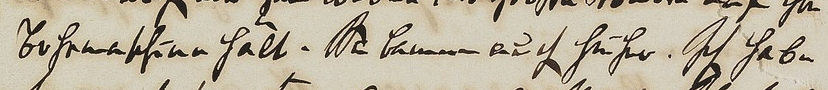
Bohrmaschine hält. Sie kamen auch hieher. Ich habe
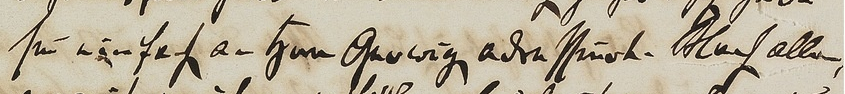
sie einfach an Herrn Gerwig adressiert. Nach allem,
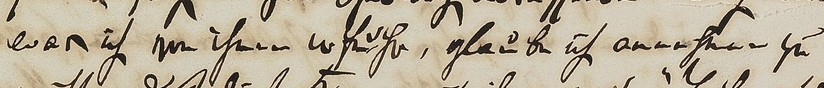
was ich von ihnen erfuhr, glaube ich annehmen zu
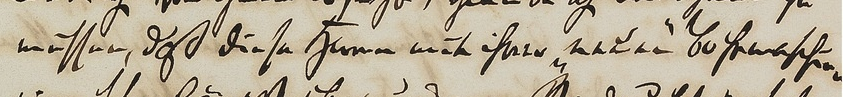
müssen, daß diese Herren mit ihrer «neuen» Bohrmaschine
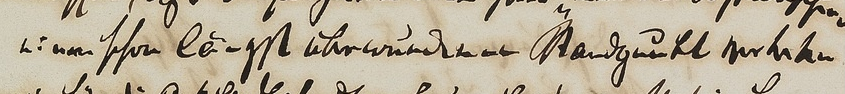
einen schon längst überwundenen Standpunkt vertreten
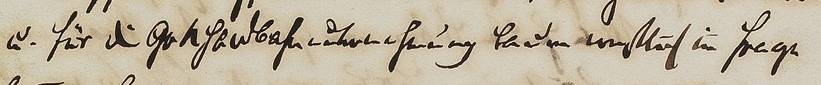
u. für die Gotthardbahnunternehmung kaum ernstlich in Frage
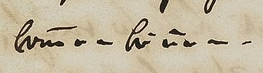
kommen können.
